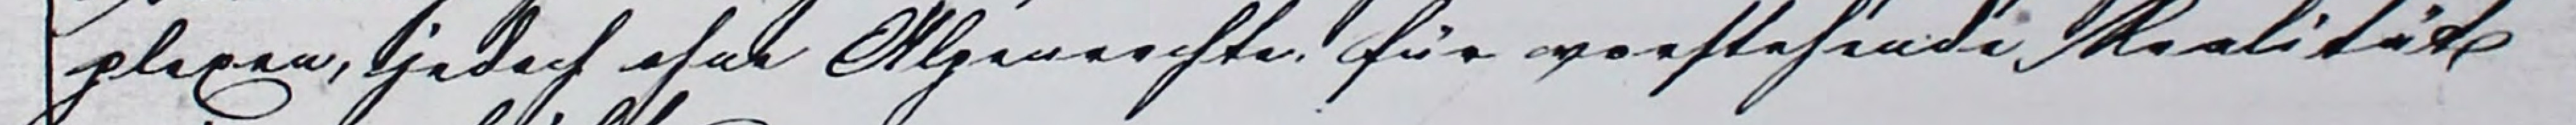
plexen, jedoch ohne Algenrechte. Für vorstehende Realität
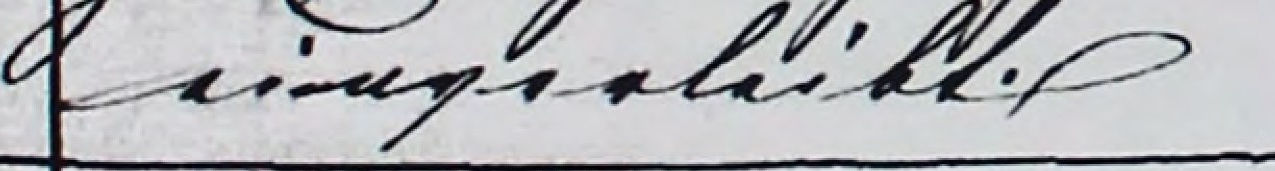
einverleibt.
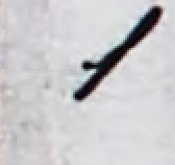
1
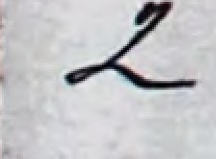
2
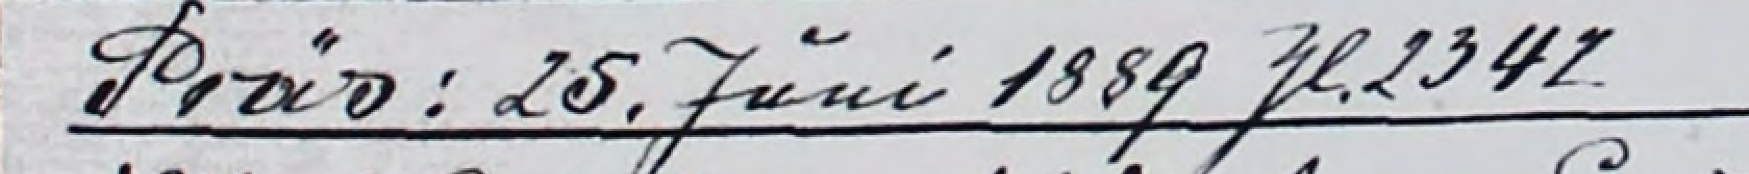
Präs: 25. Juni 1889 Zl. 2347
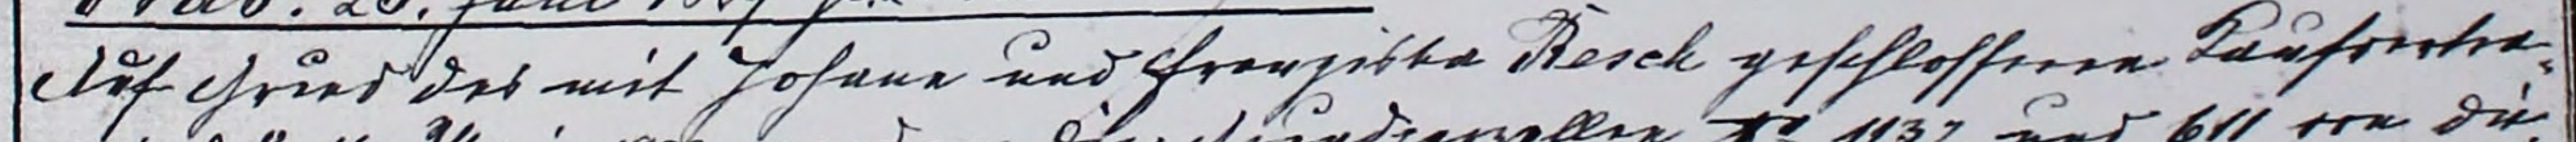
Auf Grund des mit Johane und Franziska Resch geschlossenen Kaufvertra„
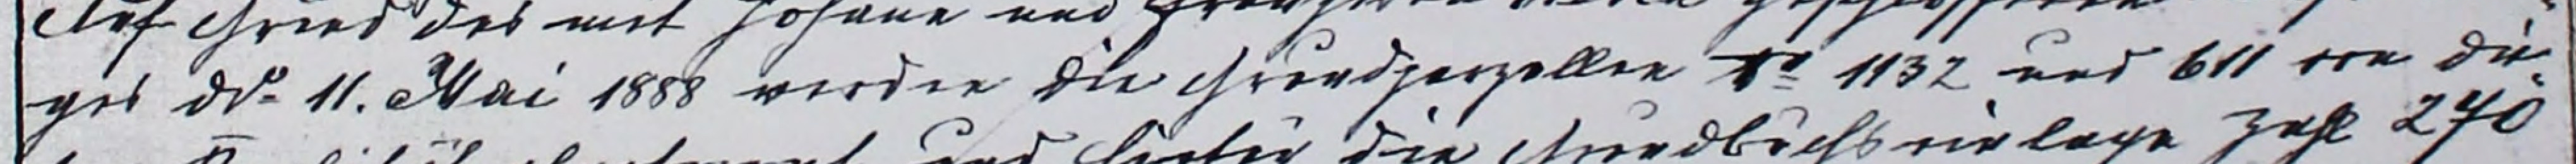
ges ddo 11. Mai 1888 werden die Grundparzellen No 1132 und 611 von die„
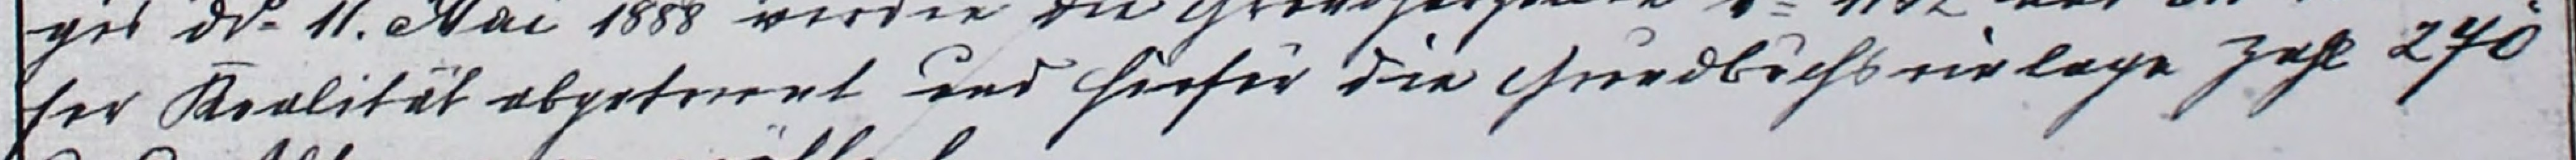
ser Realität abgetrennt und hiefür die Grundbuchseinlage zahl 270
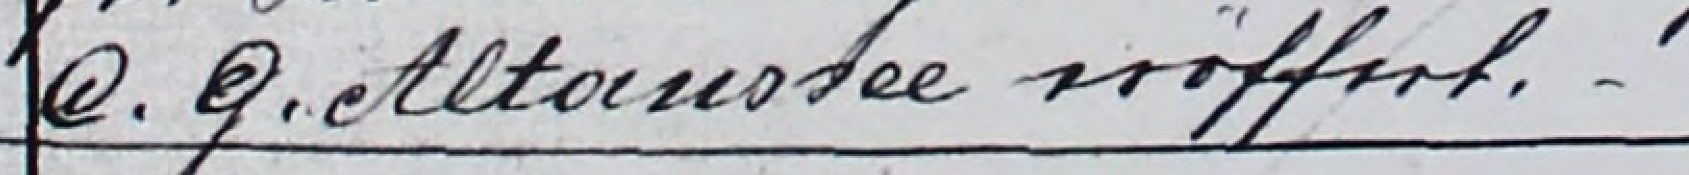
C. G. Altaussee eröffnet.-
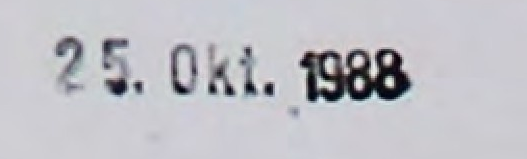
25. Okt. 1988
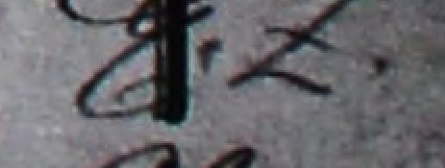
E.Z.
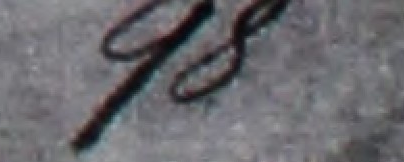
98
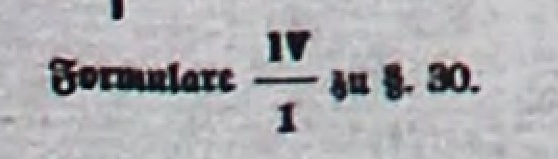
Formulare IV/1 zu §. 30.
